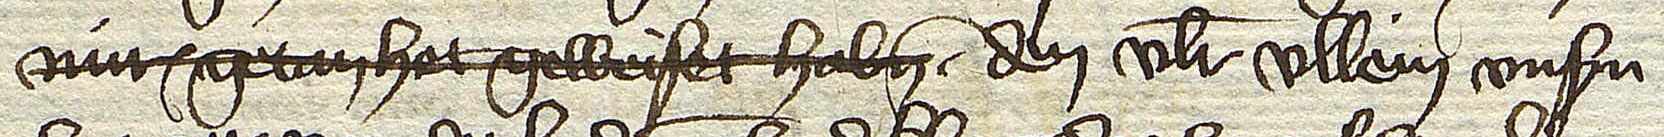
Nür* getan hat geweiſet hab*n . den vlr* vllein vnſ*n
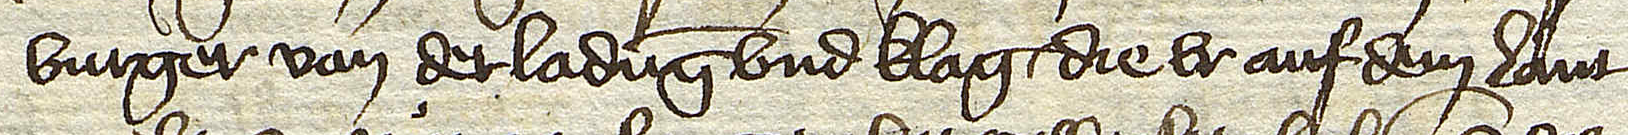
burger von der ladu*g vnd klag / die Er auf dem lant
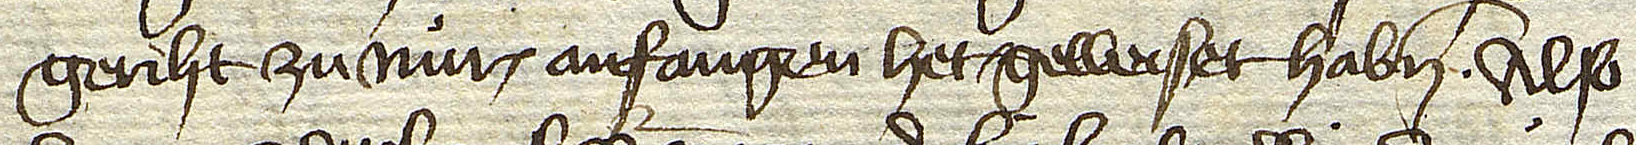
geriht cʒu Nür* anfangen het / geweiſet hab*n . Alſo
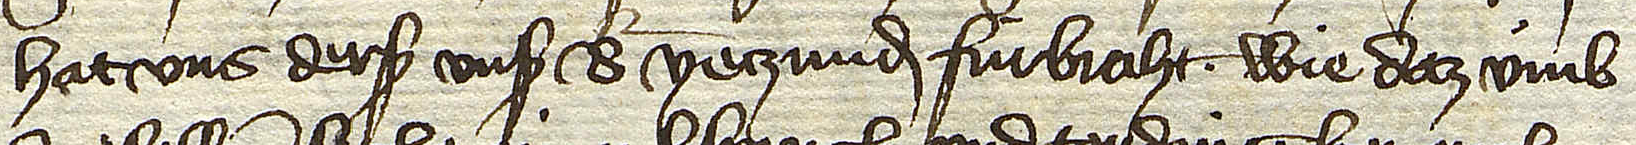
hat vns derſ* vnſ* B* yecʒund* fürbraht . wie daʒ v̈mb
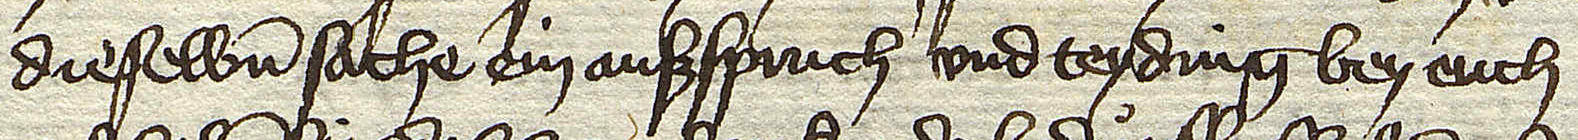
dieſelb*n ſache ein auſʒſpruch vnd teyding bey euch
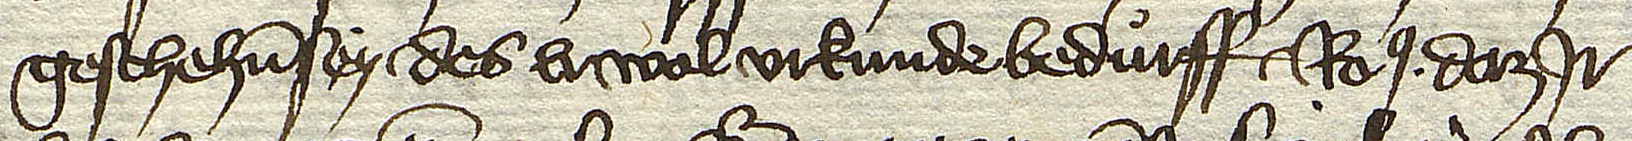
geſcheh*n ſey / des Er wol vrkunde bedürff / Ro* . daʒ Ir
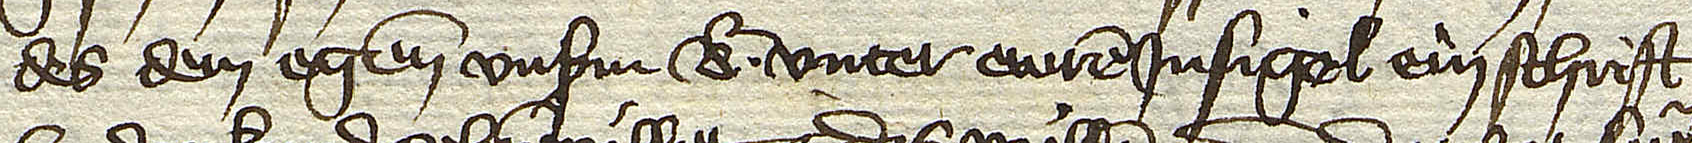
des dem ege*n vnſ*m B* . vnter ewre* Inſigel ein ſchrift
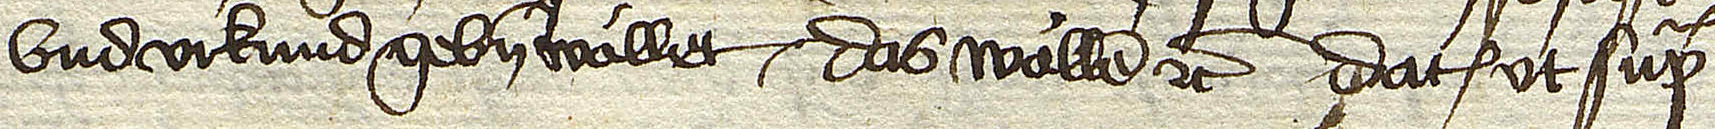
vnd vrkund geb*n wöllet / das wölle* ec* / dat* vt ſup*
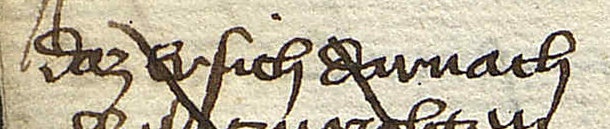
daʒ Er ſich daranach
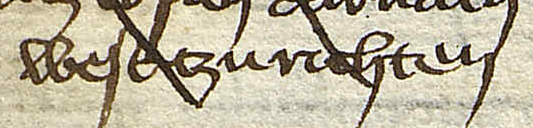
weſt cʒu richten
